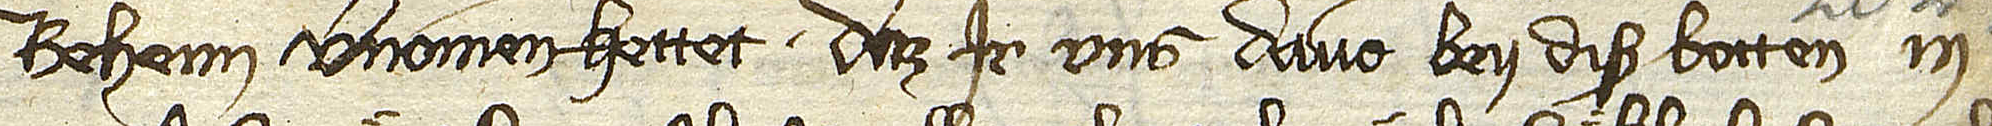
Beheim v*nomen* hettet / Daʒ Ir vns dauo* bey diſ* botten in
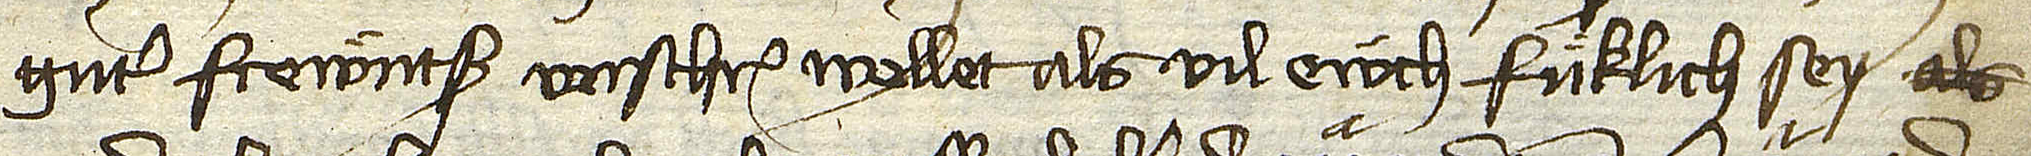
gut* frewntſ* verſchr* wellet als vil ewch füklich ſey als
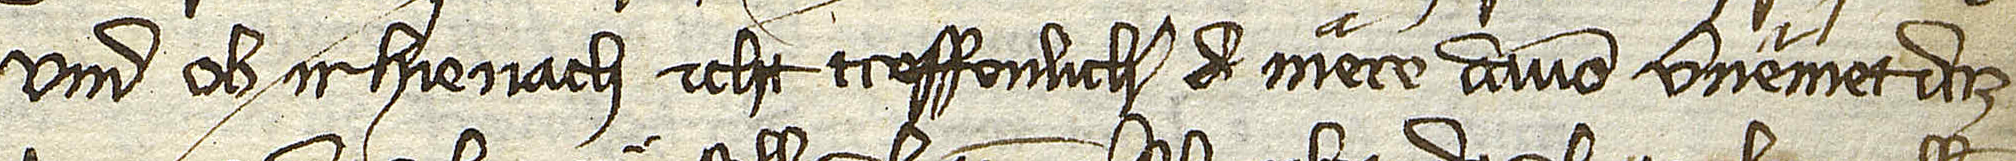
vnd ob ir hienach icht treffenlich* d mëre dauo* v*nëmet daʒ
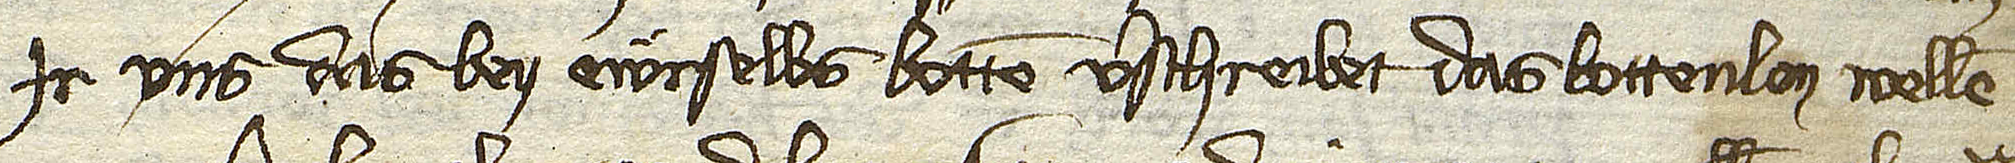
Ir vns das bey ewrſelbs botte* v*ſchreibet das bottenlon welle*
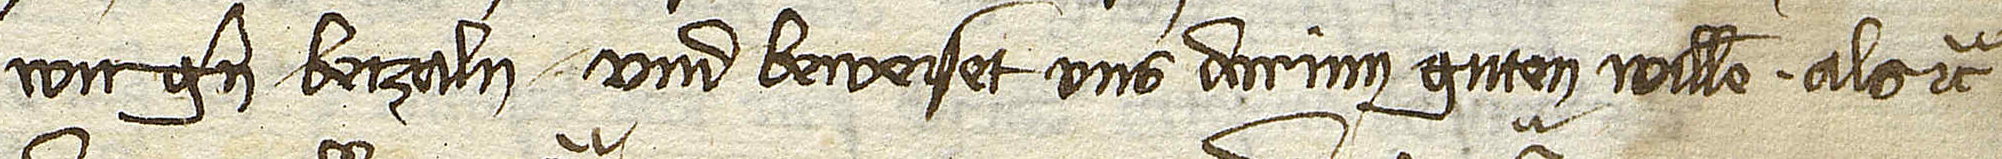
wir g*n becʒaln / vnd beweiſet vns darinn guten wille* . als ec*
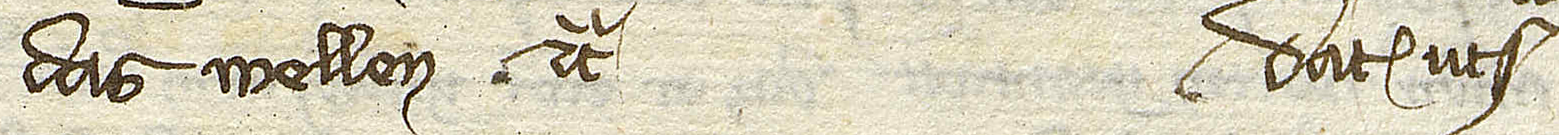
das wellen ec* / Dat* ut ſ*
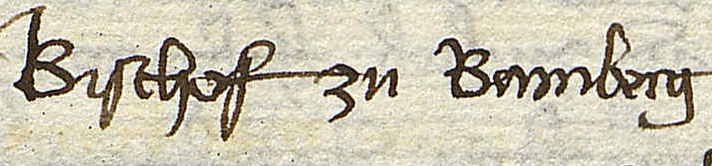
Biſchof ʒu Bamberg
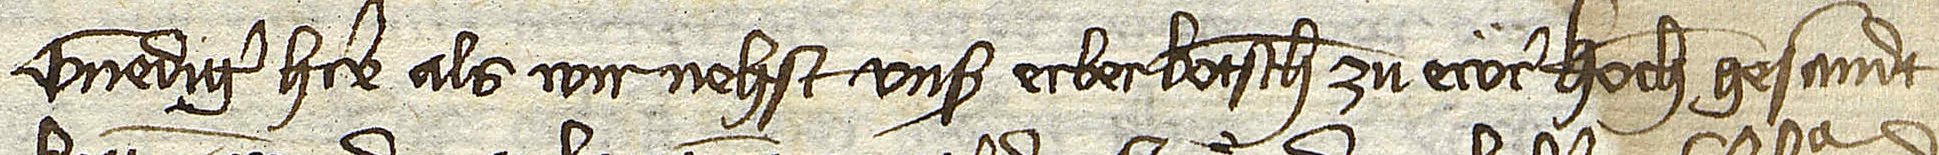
Gnedig* h*re als wir nehſt vnſ* erber botſch* ʒu ew*r hoch* geſandt
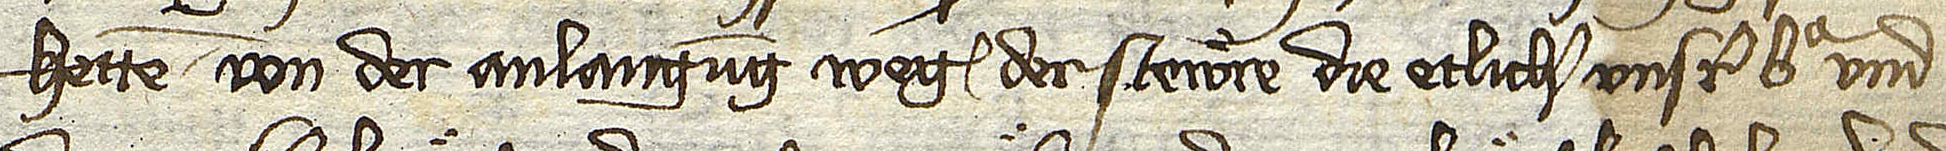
hette* / von der anlangu*g weg* der ſtewre die etlich* vnſ*r b* vnd
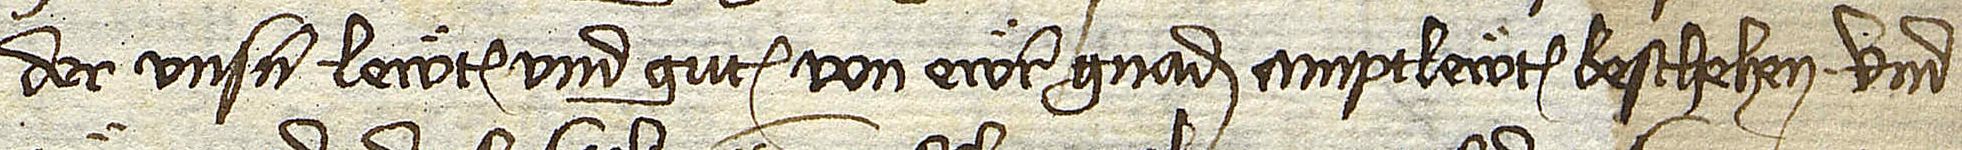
der vnſ*n lewt* vnd gut* von ew*r gnad* amptlewt* beſchehen . Vnd
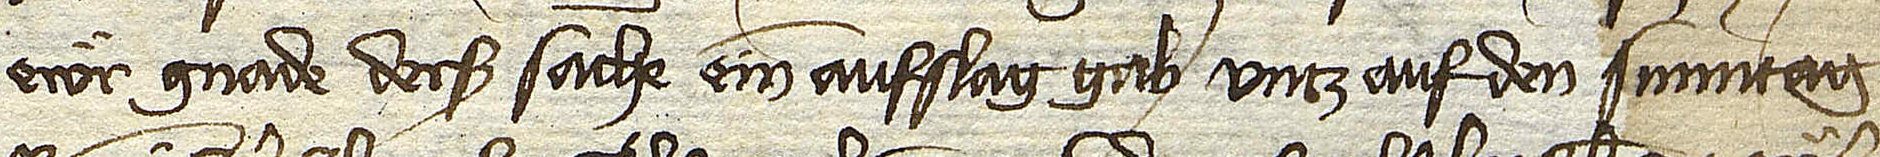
ewr gnade derſ* ſache ein* aufſlag gab vncʒ auf den ſunntag
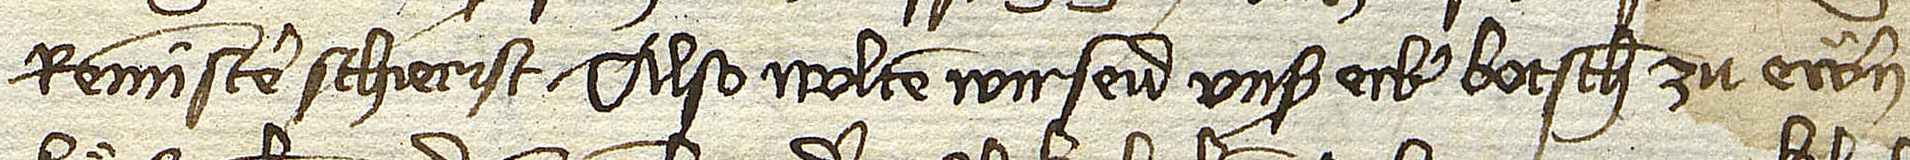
Remiſce* ſchieriſt / Alſo wolte* wir ſeid vnſ* erb* botſch* ʒu ew*n
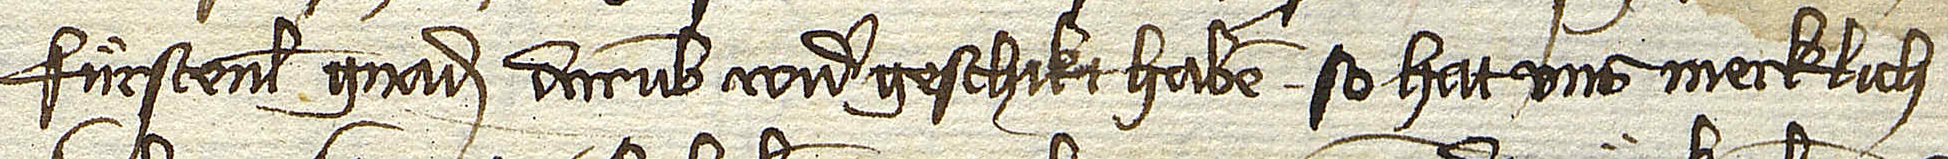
fürſtenl* gnad* daru*b wid* geſchikt habe* . ſo hat vns merklich
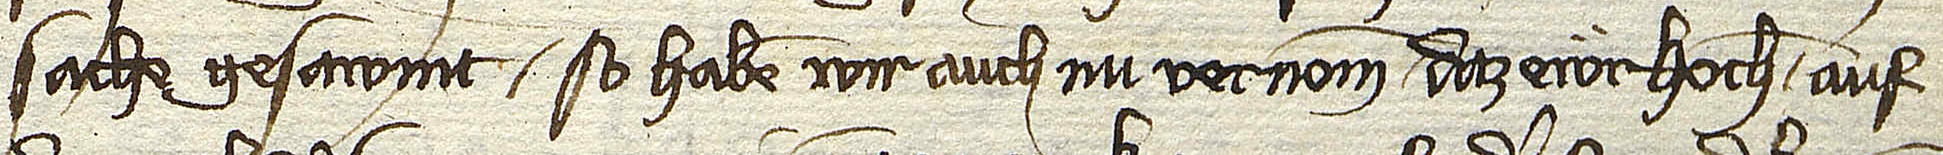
ſache geſawmt / ſo habe* wir auch nu vernom* / daʒ ewr hoch* / auf
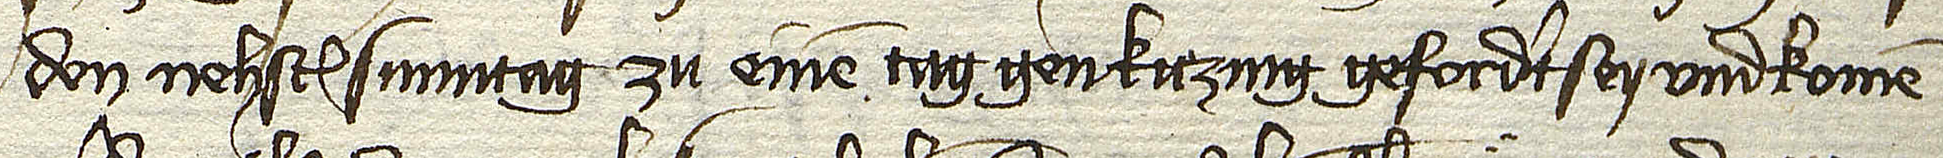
den nehſt* ſunntag ʒu eine* tag gen kicʒing geford*t ſey vnd kome*
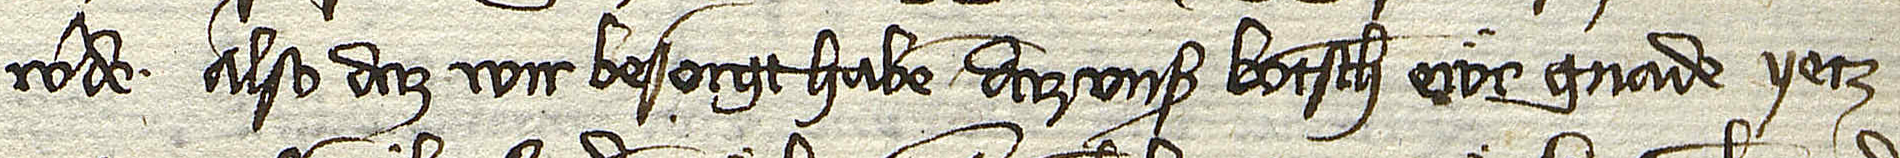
w*de . alſo daʒ wir beſorgt habe* / daʒ vnſ* botſch* ewr gnade yecʒ
